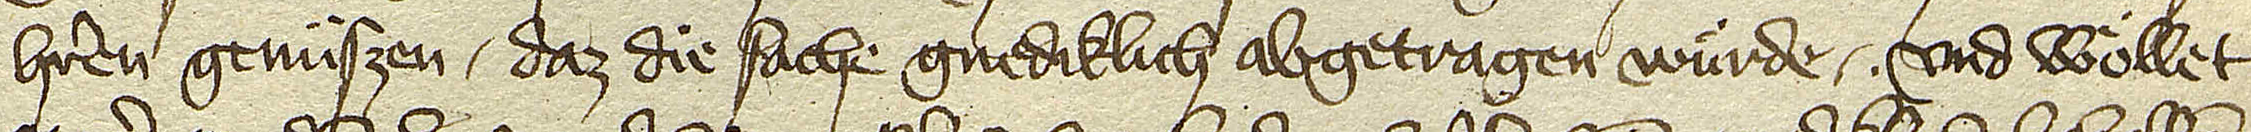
hr*en genüſʒen / daʒ die ſache gnediklich abgetragen würde / . vnd wöllet
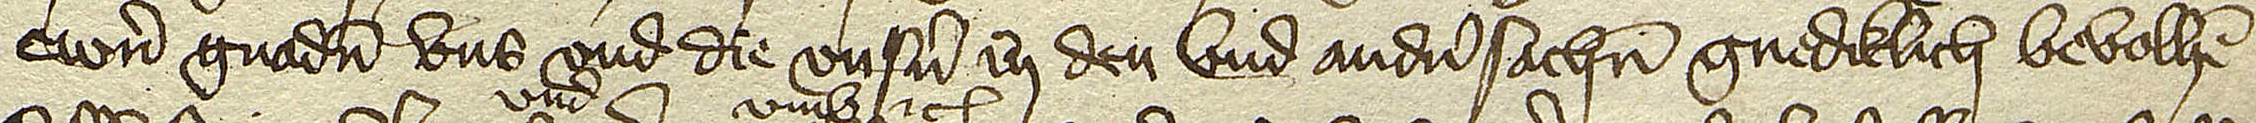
ewn* gnadn* vns vnd die vnſn* in den vnd andn* ſachn* gnediklich bevolhe*
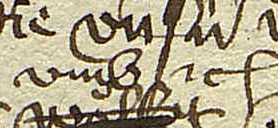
vmb ec*
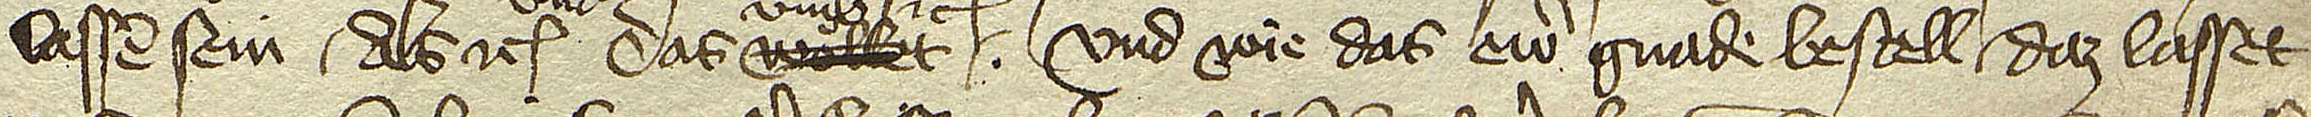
laſſe* ſein / Als ec* Das wöllet / . vnd wie das ew* gnade beſtell / daʒ laſſet
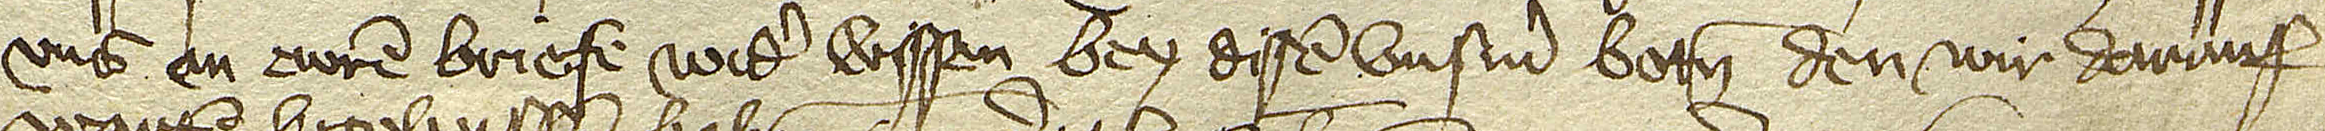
vns an ewre* briefe wid* wiſſen bey diſe* vnſm* botn* den wir darauf
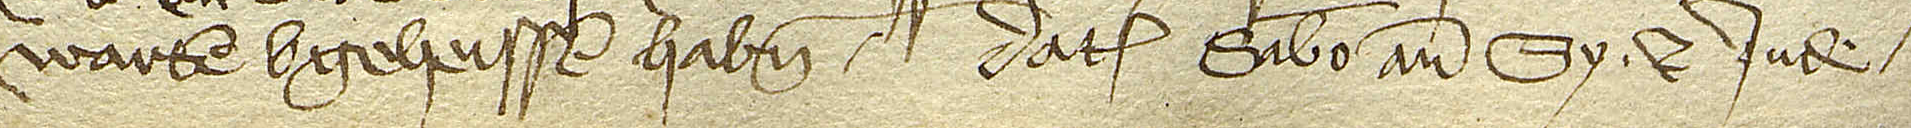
warte* % geheiſſe* habn* / dat* Sabo* an* Sy. @ Iude /
